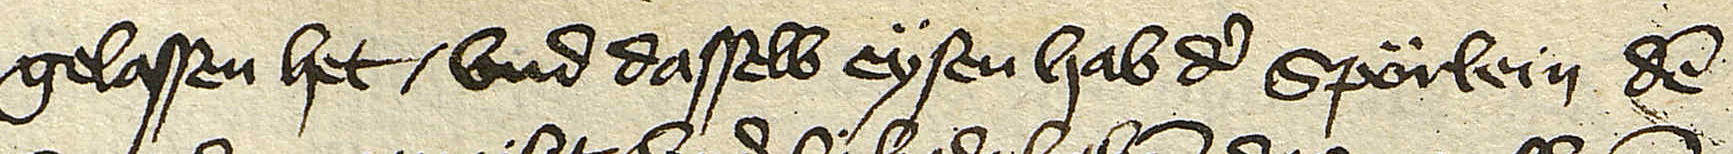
gelaſſen het / vnd daſſelb eyſen hab d* Spörlein de*
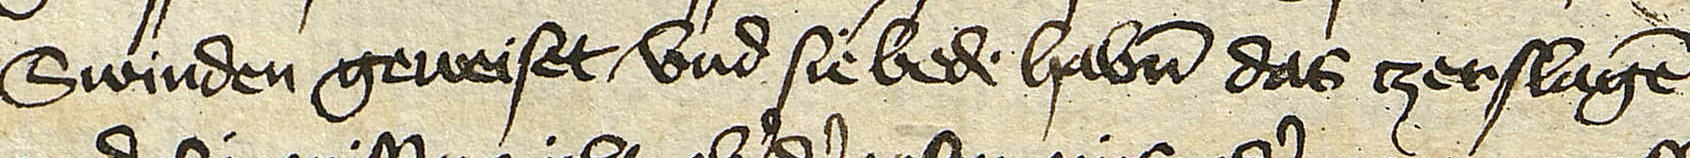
Swinden geweiſet / vnd ſie bede habn* das cʒerſlage*
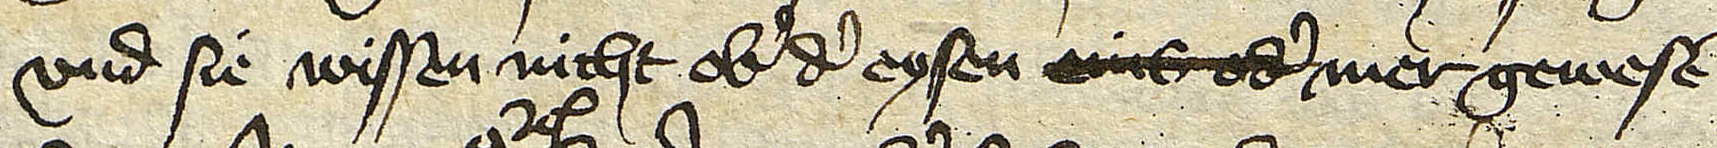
vnd ſie wiſſen nicht ob* d* eyſen eins od* mer geweſe*
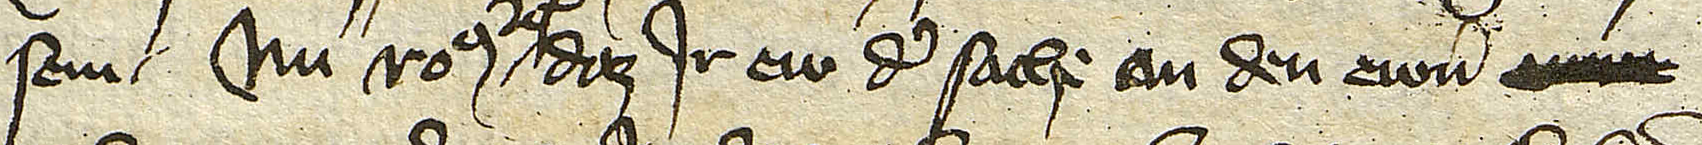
ſein / Nu ro* / daʒ Ir ew d* ſache an den ewn* %%%
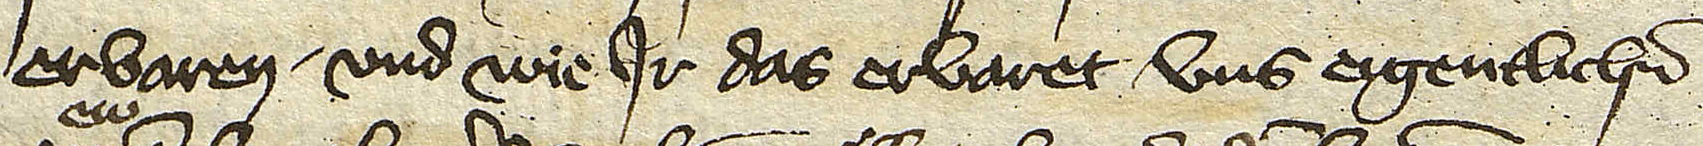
ervaren / vnd wie Ir das ervaret / vns eigentlichn*
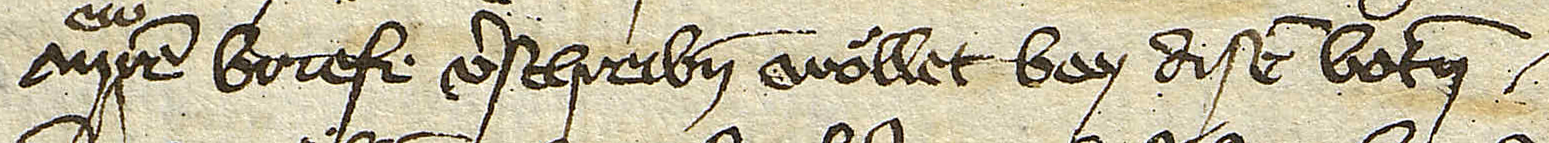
an re* briefe v*ſchreibn* wöllet bey diſe* botn* /
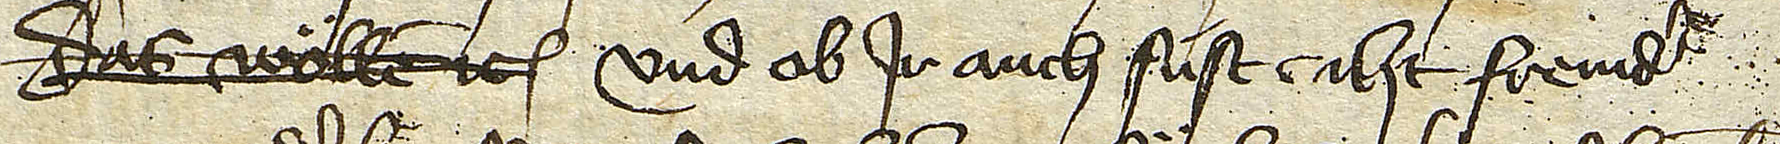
Das wölle* ec* vnd ob Ir auch ſüſt / iht fremd*
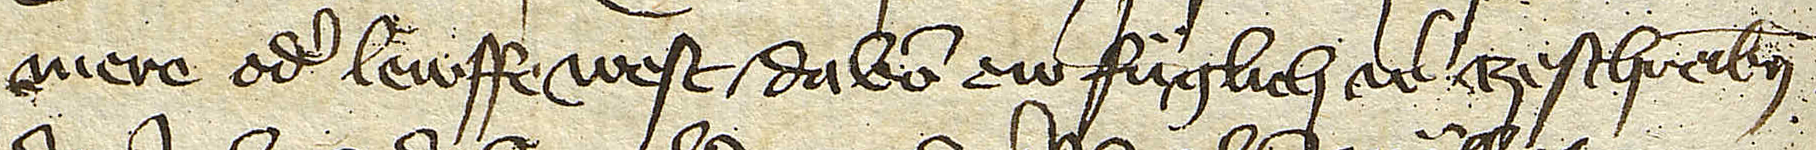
mere od* lewffe weſt / davo* ew füglich w* cʒeſchreibn*
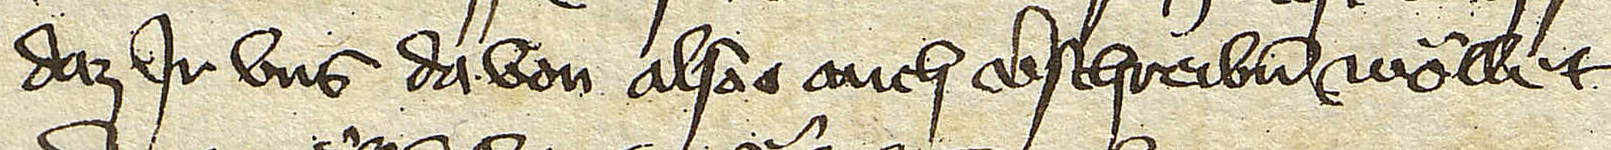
daʒ Ir vns davon alſo a auch v*ſchreibn* wöllet
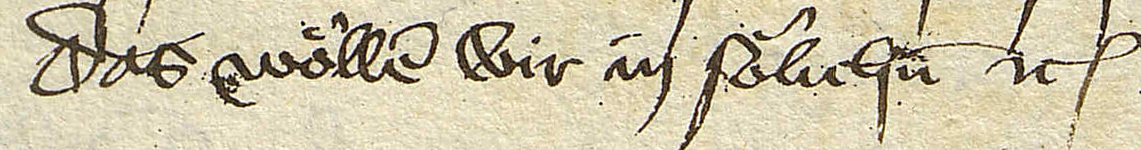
Das wölle* wir in ſölichn* ec*
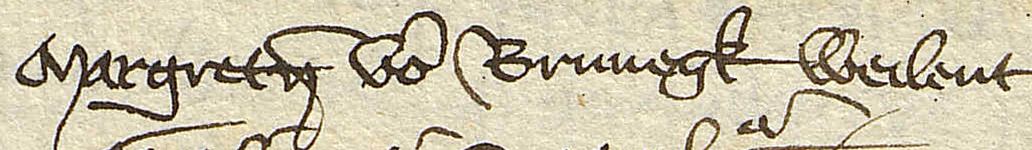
Margretn* vo* Brunegk weilent
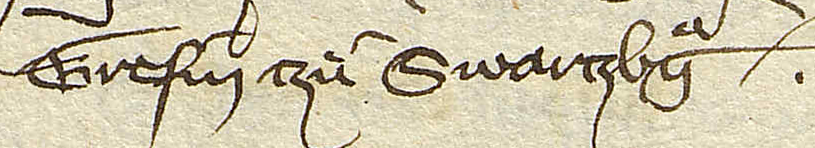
Grefin cʒü Swarcʒb*g / .
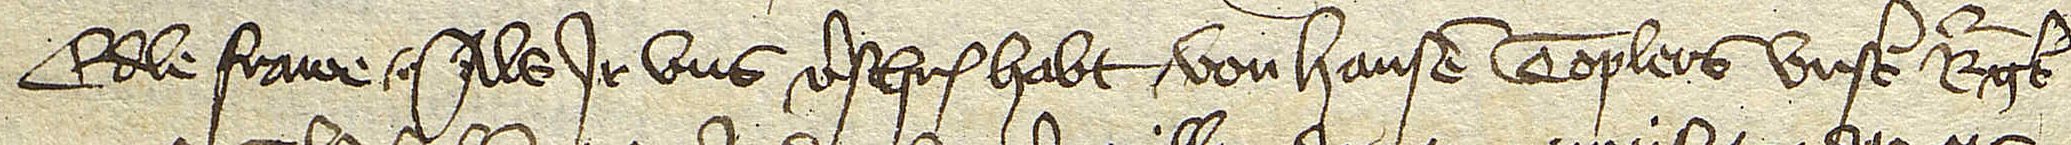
Edle frawe / . Als Ir vns v*ſchr* habt / von hanſe* Toplers vnſs* B*gs*
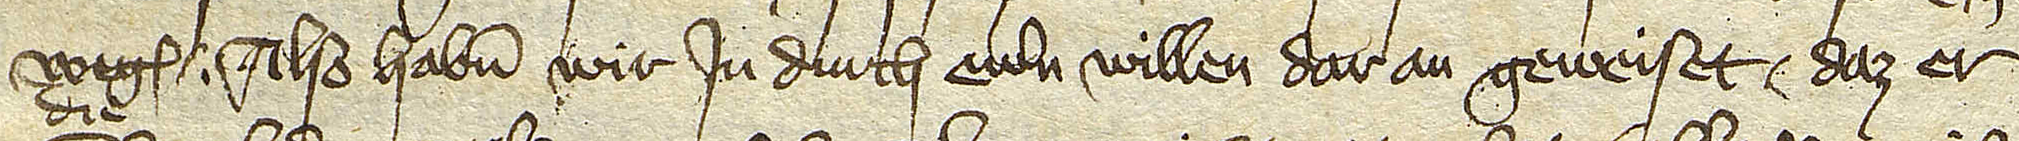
weg* / . Alſo habn* wir In durch ew*n willen daran geweiſet / daʒ er
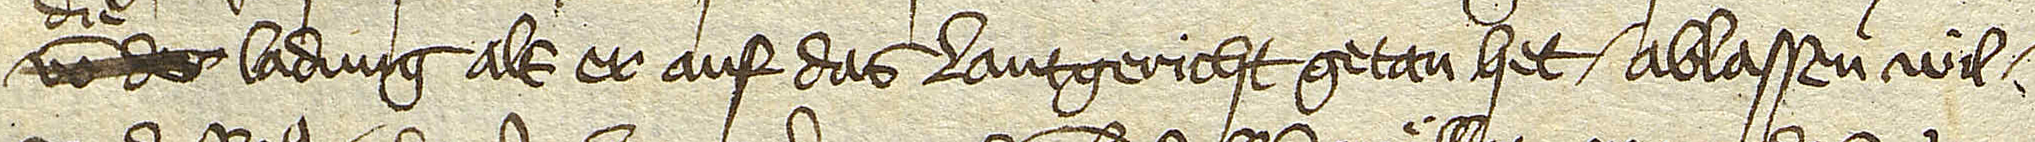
vo* der ladung als er auf das Lantgericht getan het / ablaſſen wil / .
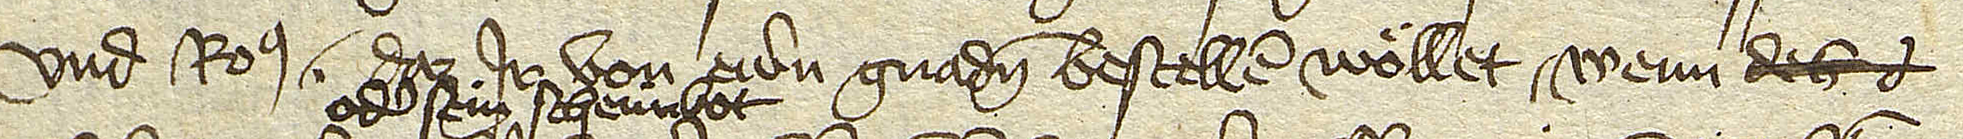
vnd Ro* / . daʒ Ir von ew*n gnadn* beſtelle* wöllet / wenn des %
